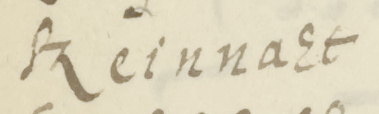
Keinnart
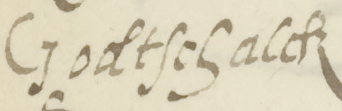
Godtschalck
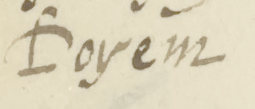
Doyem
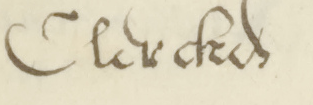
Clercken
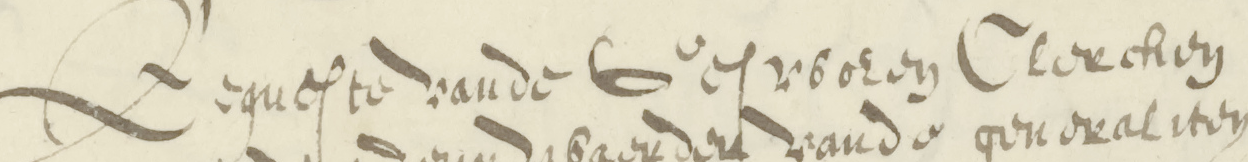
Requeste vande Gesworen Clercken
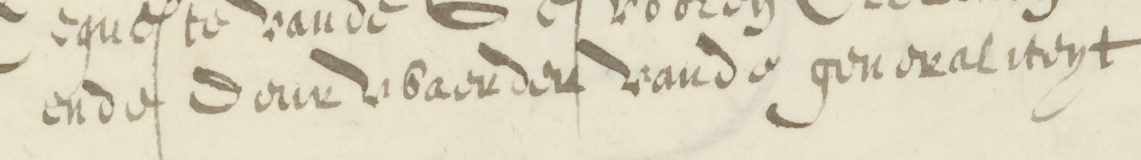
ende deurwaerder vande generaliteyt
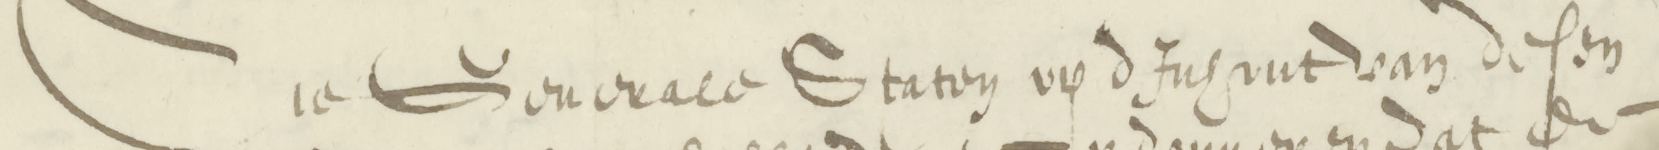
Die Generale Staten op d'inhaut van desen
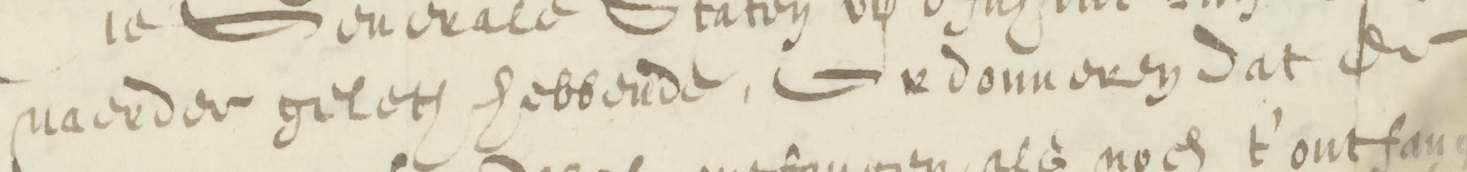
naerder geleth hebbende, Ordonneren dat de
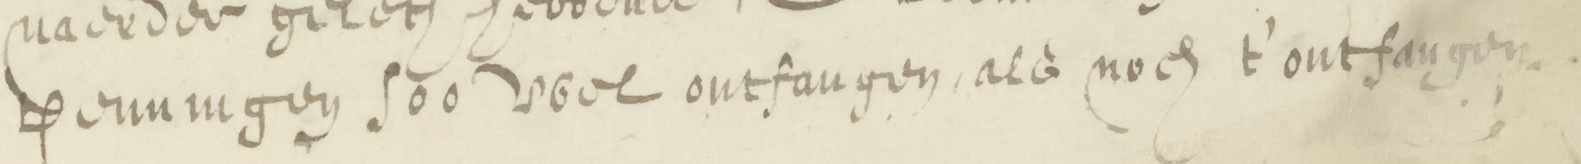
penningen soo wel ontfangen, als noch t'ontfangen
